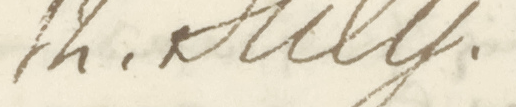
12. Julij.
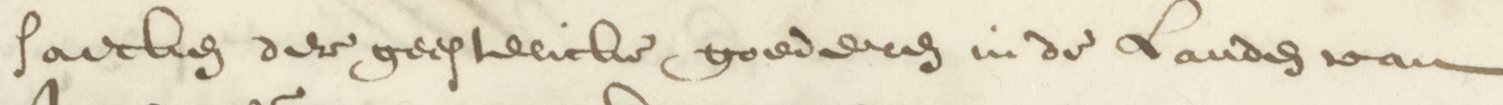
saecken der geestelicke goederen in de Landen van
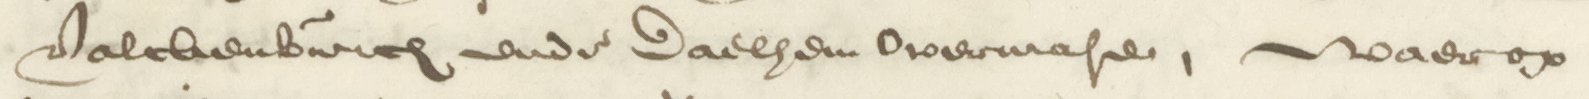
Valckenburch ende Daelhem Overmase. Waerop
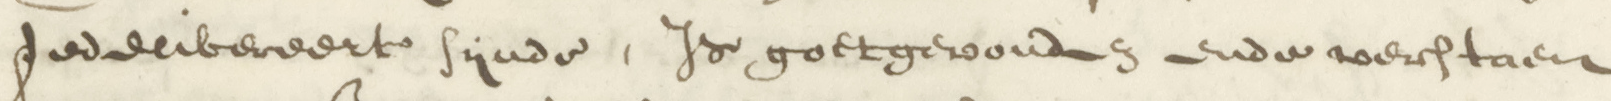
gedelibereert sijnde, Is goetgevonden ende verstaen
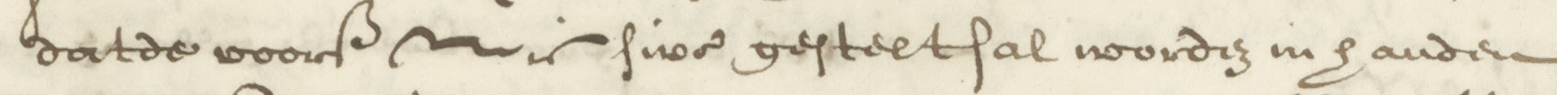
dat de voors missive gestelt sal worden in handen
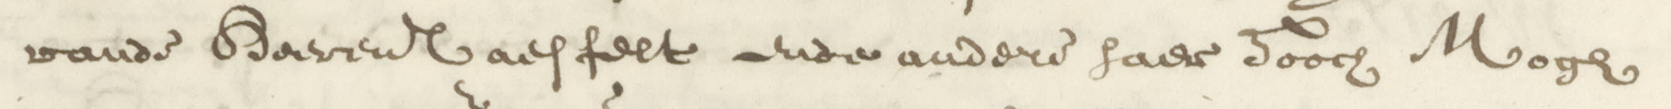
vande Heeren Raesfelt ende andere haer Hooch Mogh
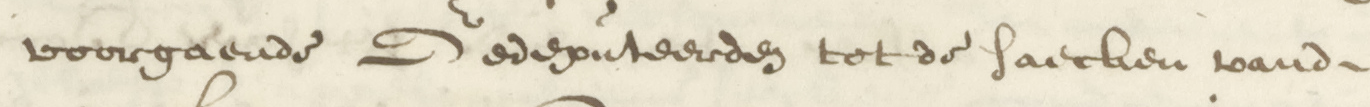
voorgaende Gedeputeerden tot de saecken vanden
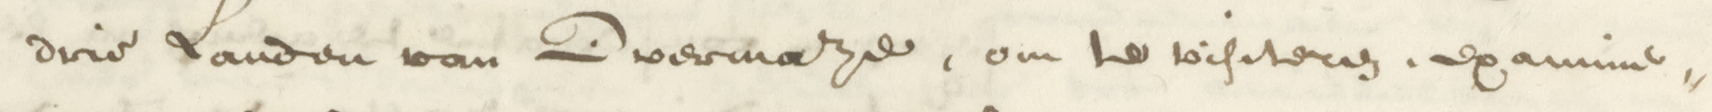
drie Landen van Overmaze, om te visiteren, examine,,
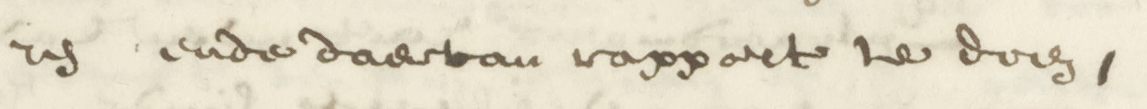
ren, ende daervan rapport te doen.
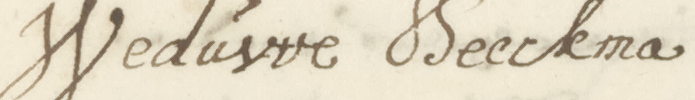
Weduwe Beeckma
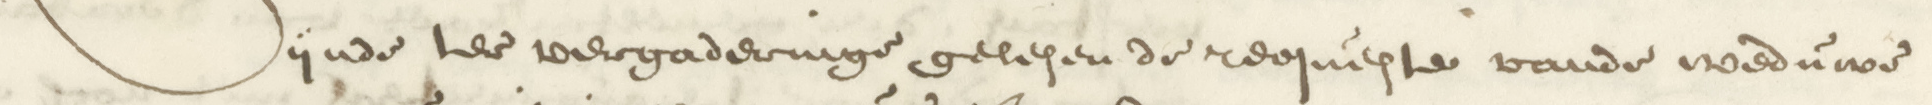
Sijnde ter vergaderinge gelesen de requeste vande weduwe
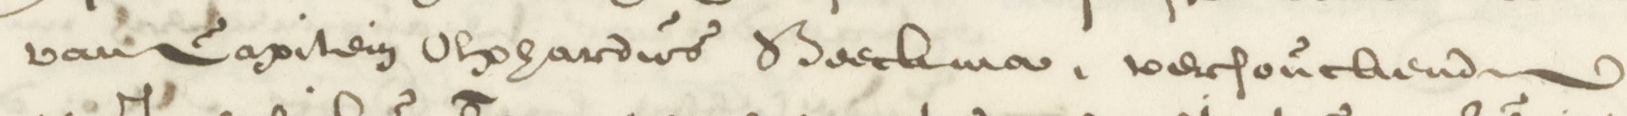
van Capitein Olphardus Heeckma, versouckende
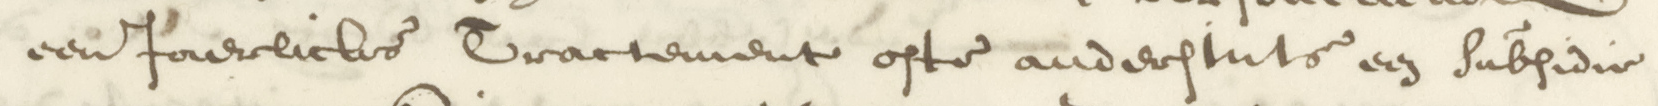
een Jaerlicks Tractement ofte andersints een subsidie
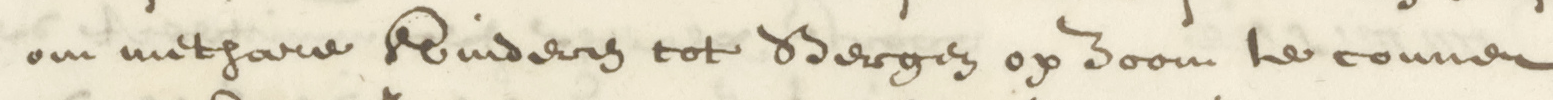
om met hare Kinderen tot Bergen op Zoom te connen
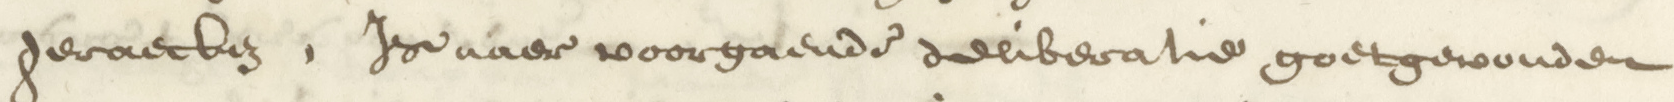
geraecken. Is naer voorgaende deliberatie goetgevonden
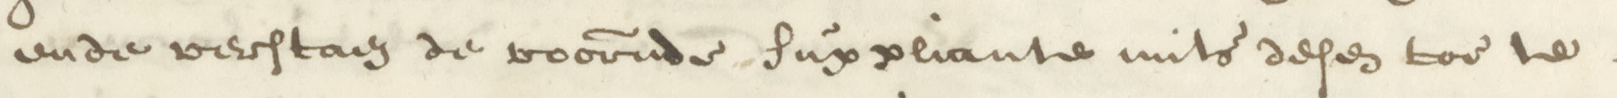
ende verstaen de voornde suppliante mits desen toe te
